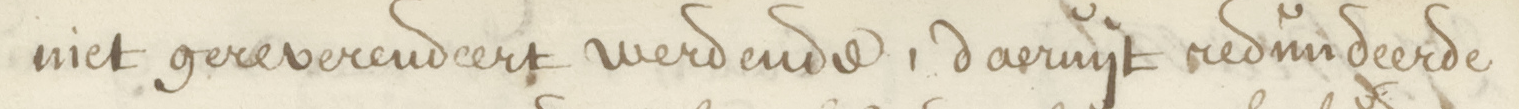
niet gereverendeert werdende, daeruijt redundeerde
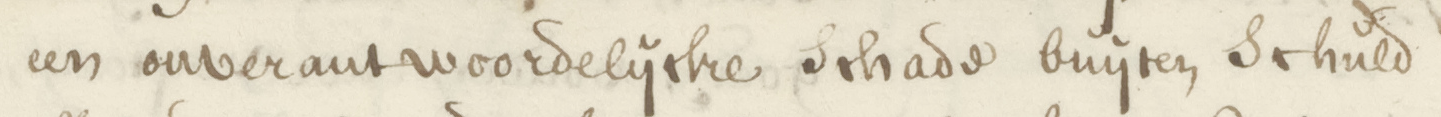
een onverantwoordelijcke Schade buijten Schuld
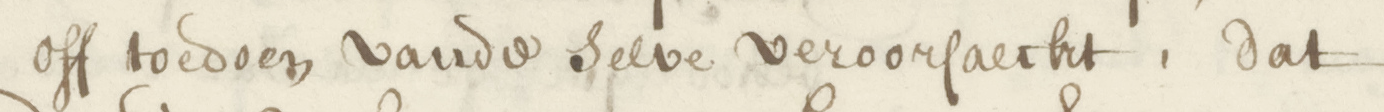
off toedoen vande selve veroorsaeckt, dat
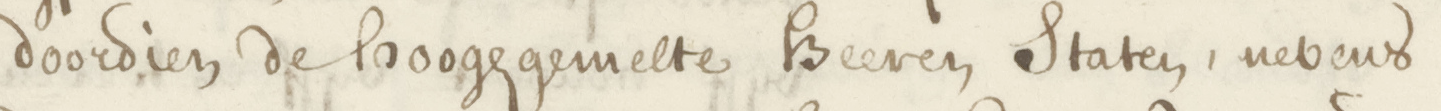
doordien de hooghgemelte heeren Staten, nevens
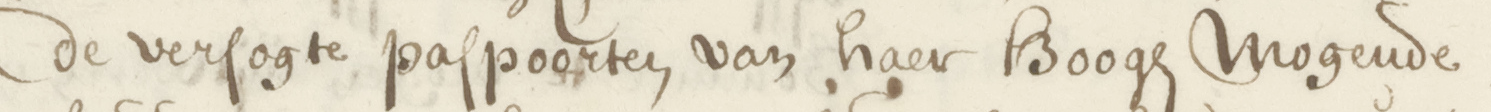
de versogte paspoorten van haer Hoogh Mogende
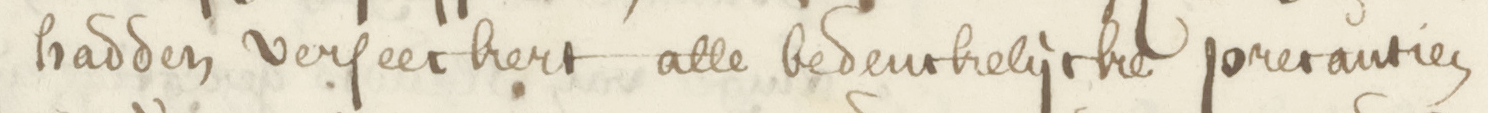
hadden verseeckert alle bedenckelijcke precautien
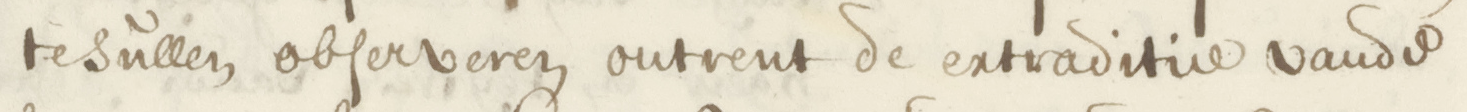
te sullen observeren ontrent de extraditie vande
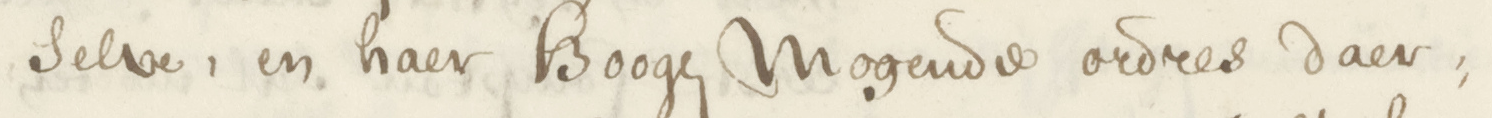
selve, en haer Hoogh Mogende ordres daer„
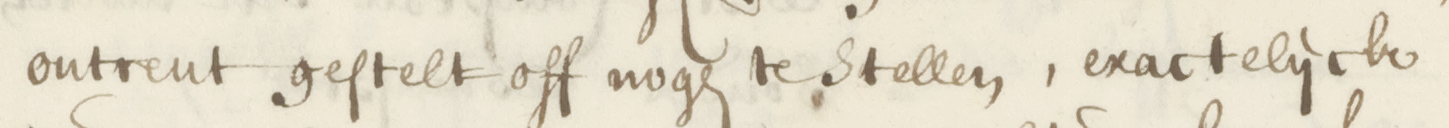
ontrent gestelt off nogh te stellen, exactelijck
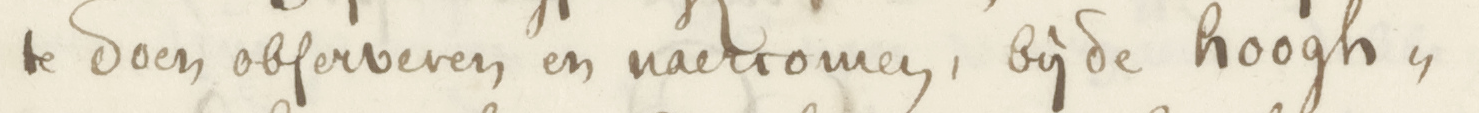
te doen observeren en naercomen, bij de Hoogh„
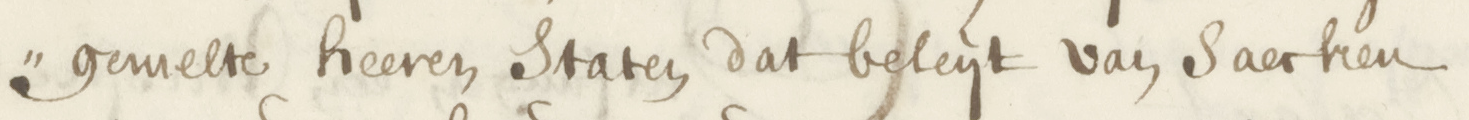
„gemelte heeren Staten dat beleijt van Saecken
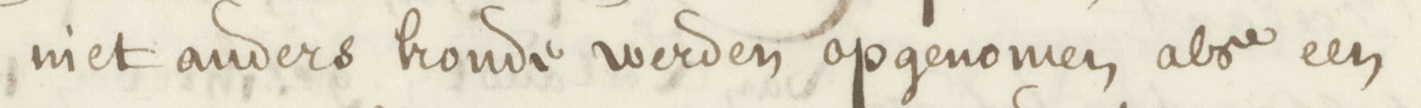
niet anders konde werden opgenomen als een
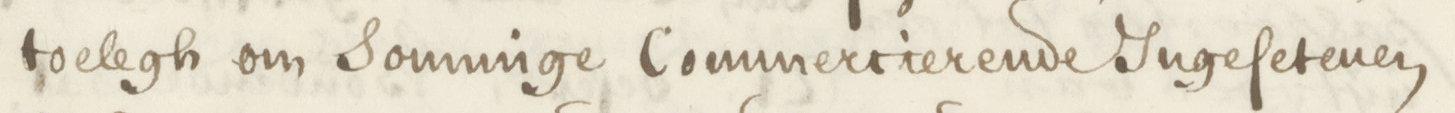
toelegh om sommige Commercierende Ingesetenen
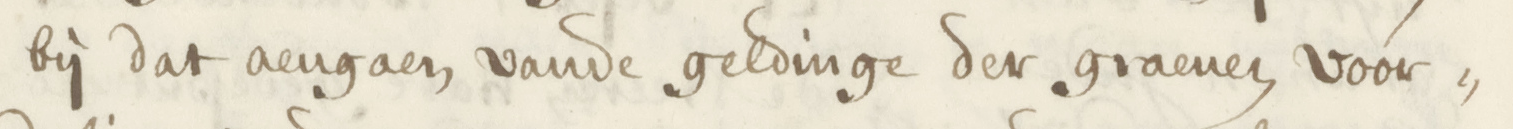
bij dat aengaen vande geldinge der graenen voor„
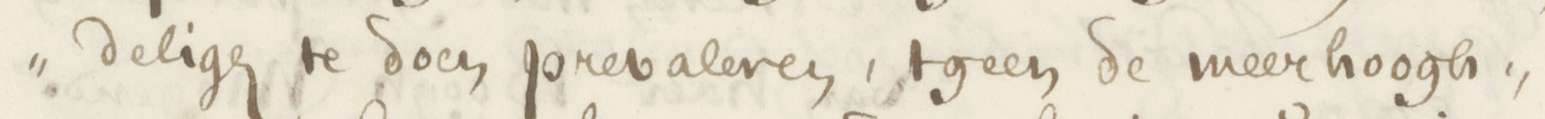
„deligh te doen prevaleren, tgeen de meerhoogh„
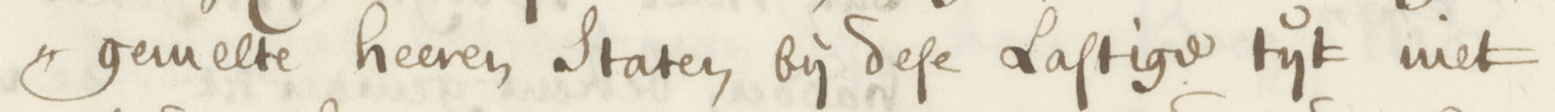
„gemelte heeren Staten bij dese Lastige tijt niet
